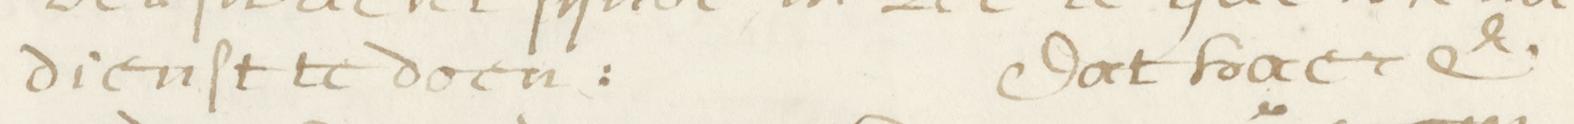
dienst te doen: Dat haer E.
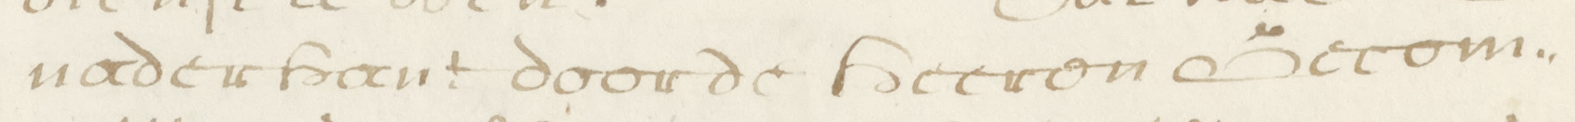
naderhant door de Heeren Gecom,,
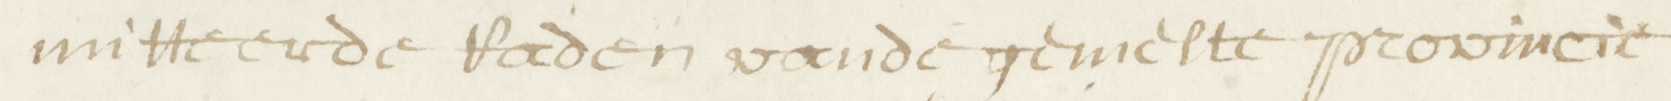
mitteerde Raden vande gemelte provincie
